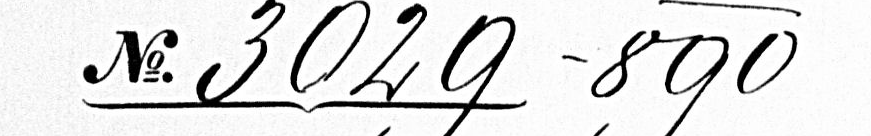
Nr. 3029-890
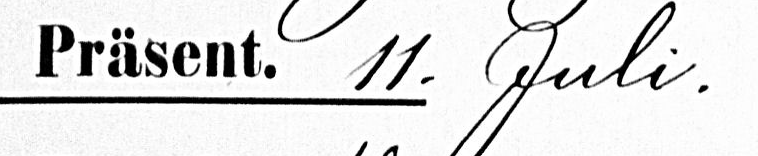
Präsent. 11. Juli.
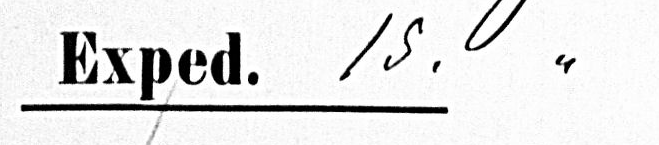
Exped. 15. Juli.
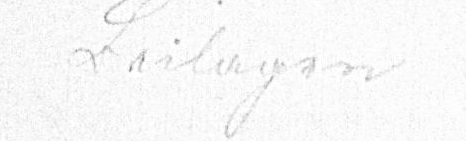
Beilagen
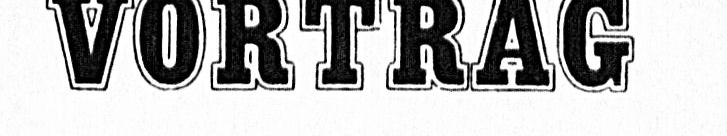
VORTRAG
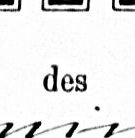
des
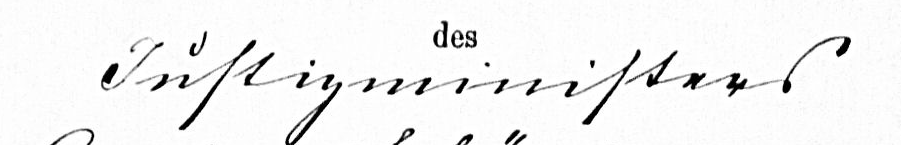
Justizministers
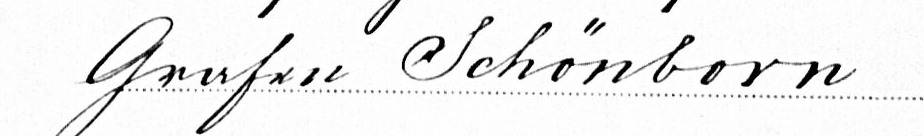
Grafen Schönborn
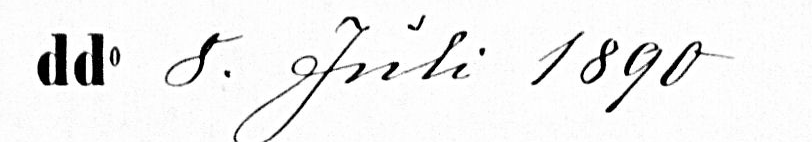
dd° 8. Juli 1890
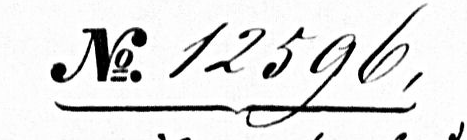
Nr. 12596,
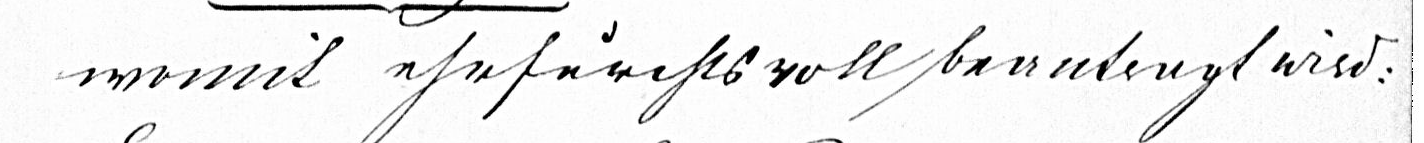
womit ehrfürchtsvoll beantragt wird:
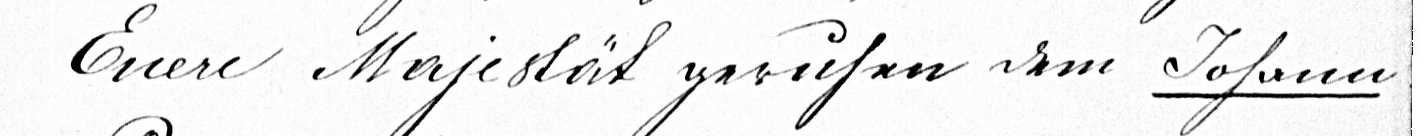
Euere Majestät geruhen dem Johann
